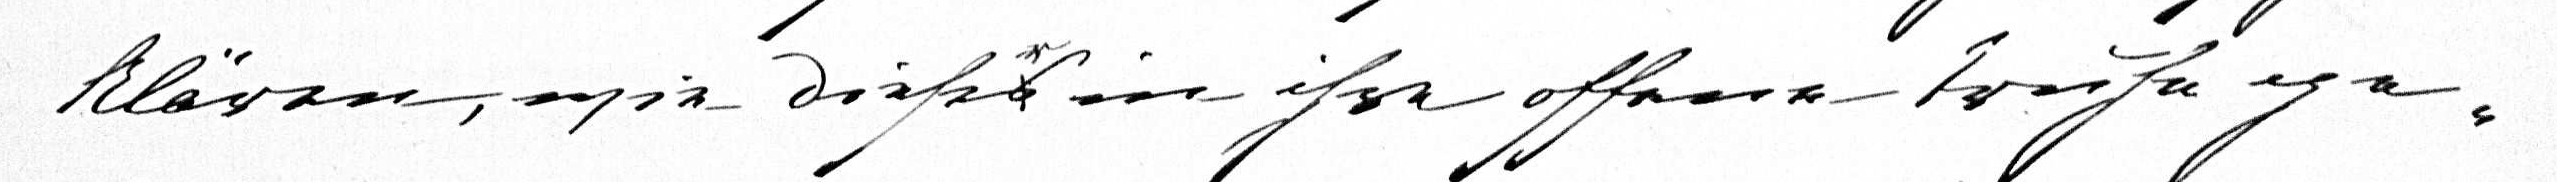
klären, wie dieser in ihre offene Truhe ge¬
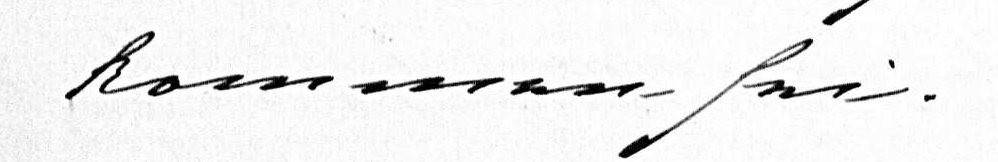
kommen sei.
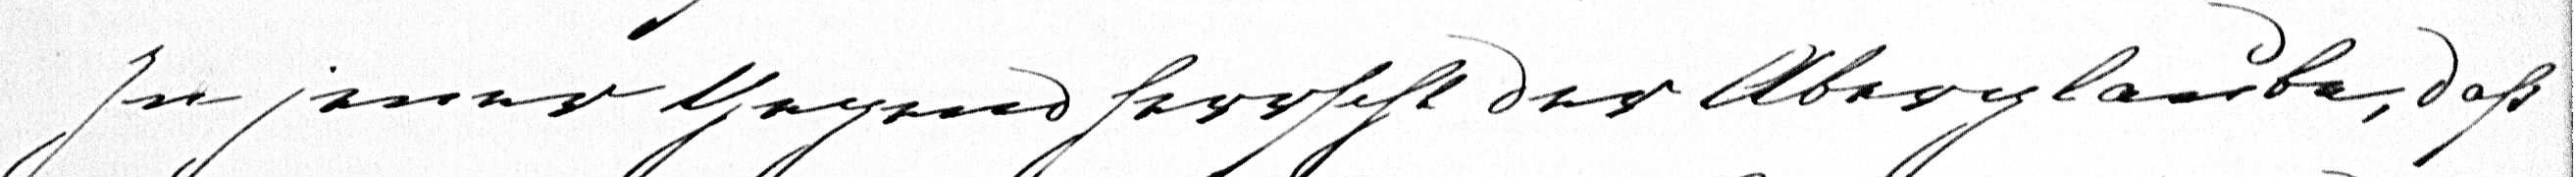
Jn jener Gegend herrscht der Oberglaube, daß
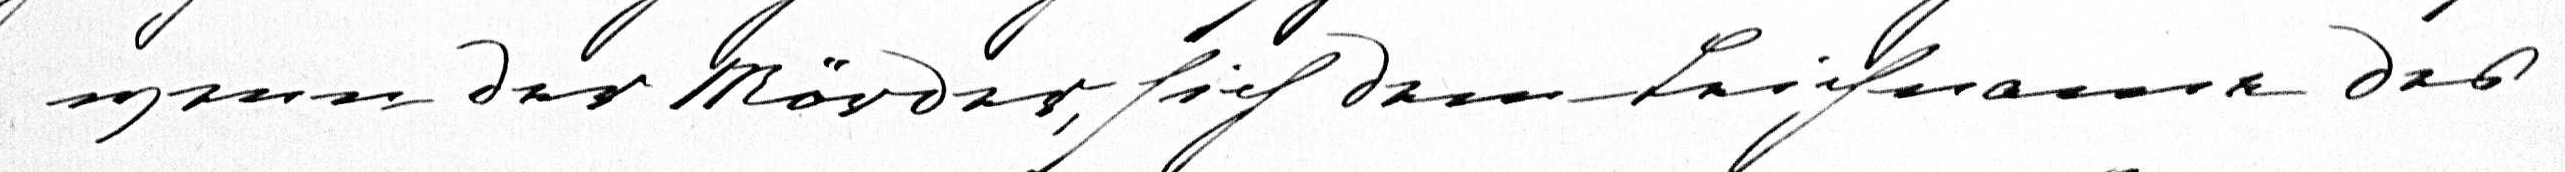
wenn der Mörder, sich dem Leichname des
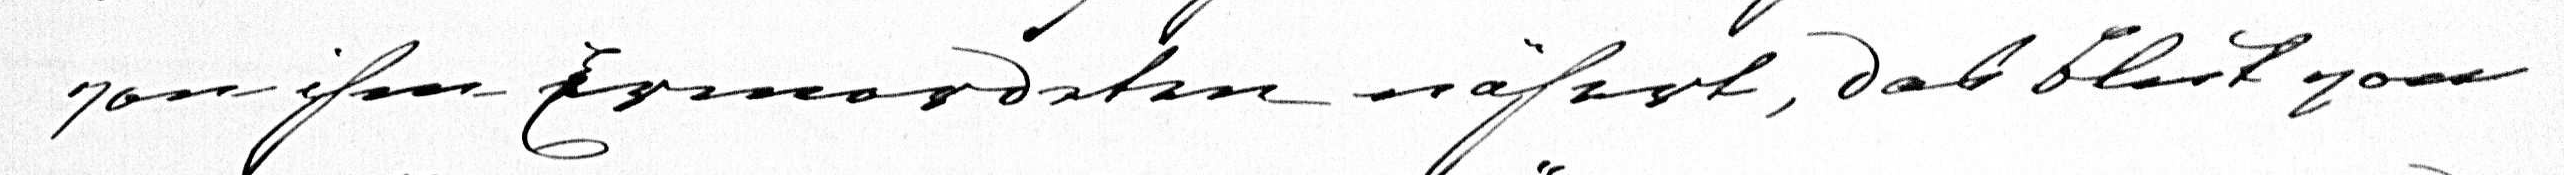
von ihm Ermordeten nähert, das Blut von
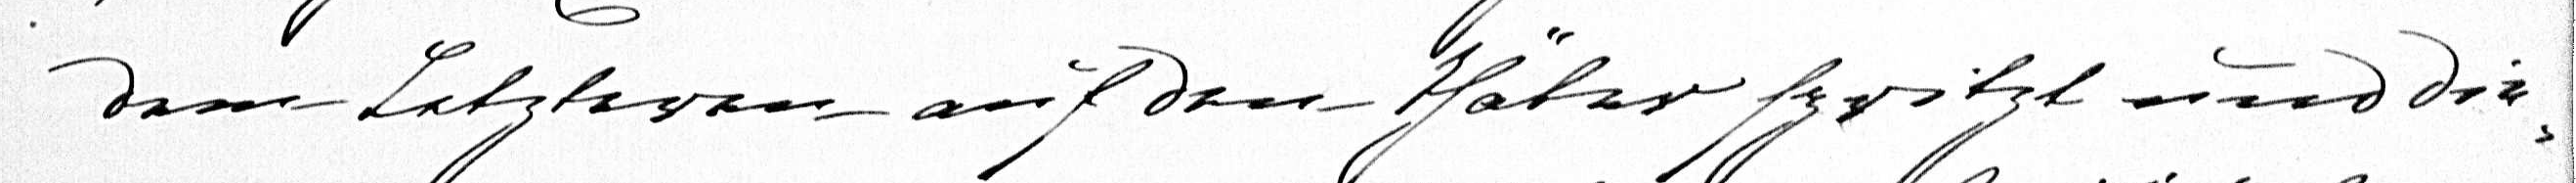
dem Letzteren auf den Thäter spritzt und die¬
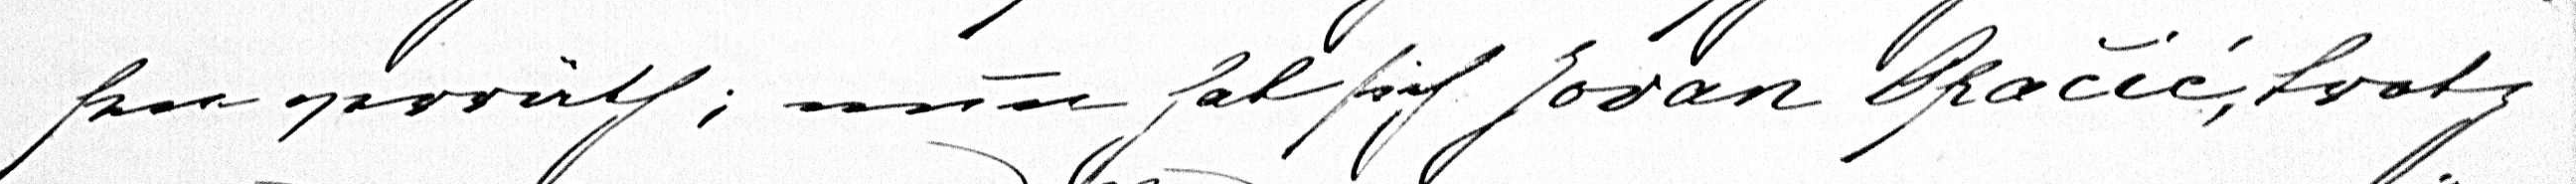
sen verräth; nun hat sich Jovan Opačić, trotz
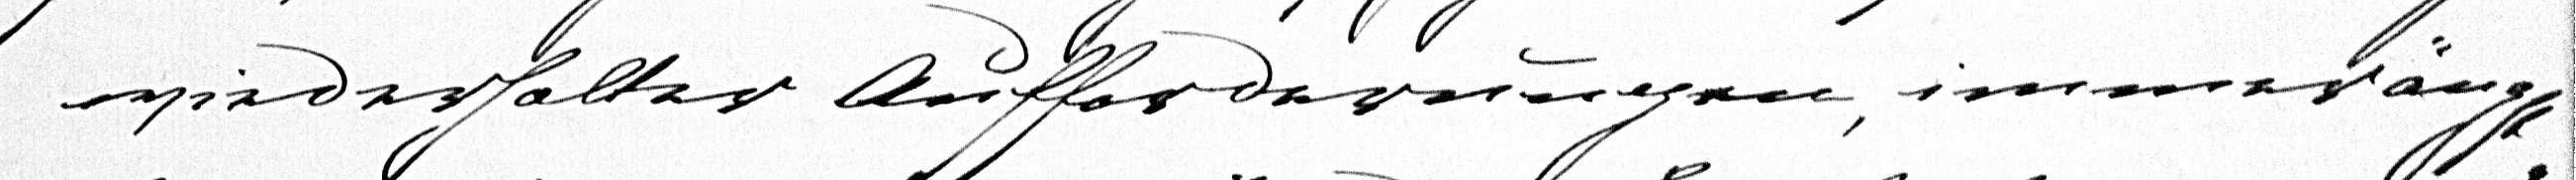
wiederholter Aufforderungen, immerängst¬
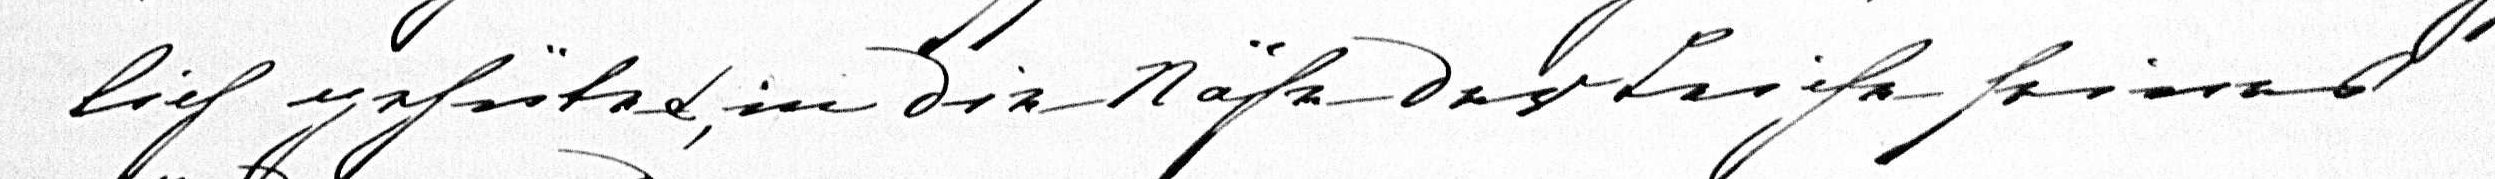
lich gehütet, in die Nähe der Leiche seines
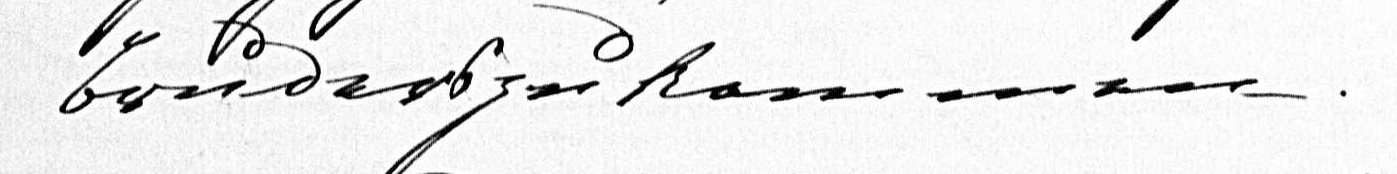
Bruders zu kommen.
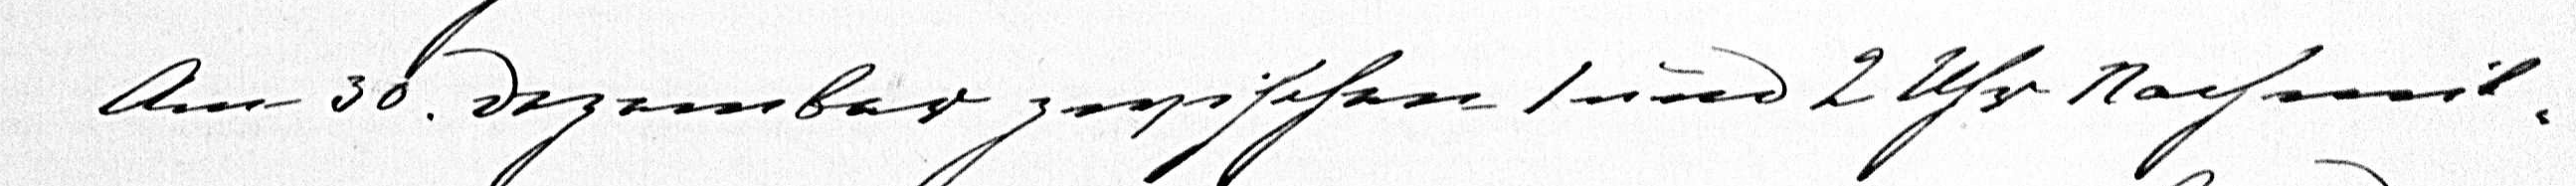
Am 30. Dezember zwischen 1 und 2 Uhr Nachmit¬
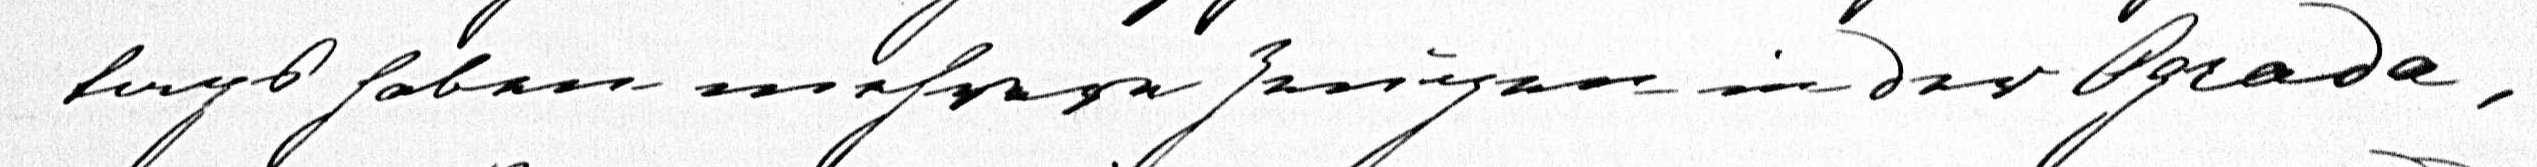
tags haben mehrere Zeugen in der Ograda,
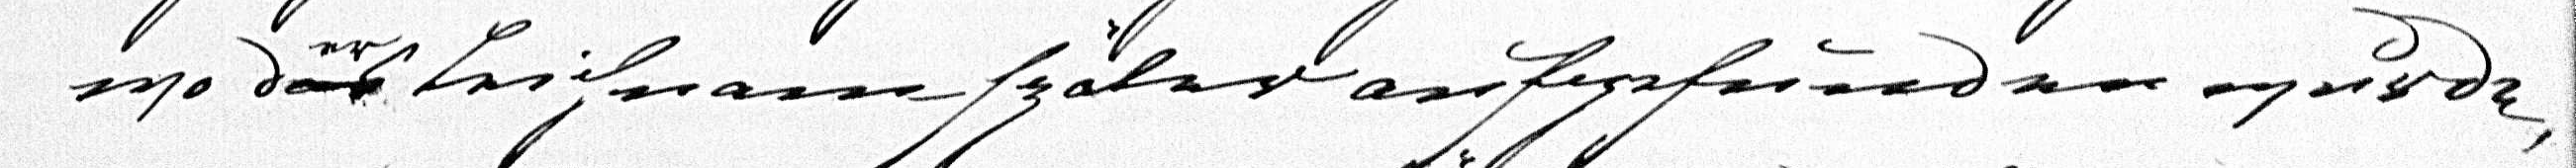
wo der Leichnam später aufgefunden wurde,
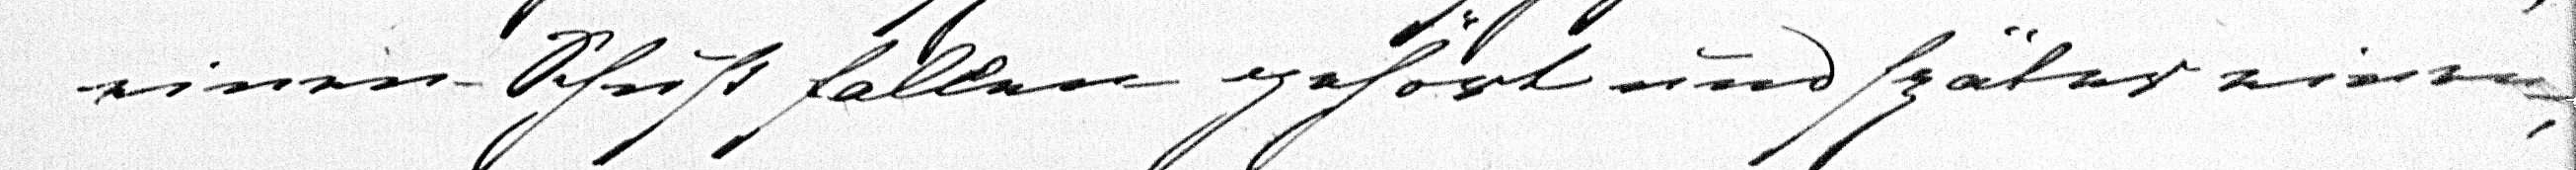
einen Schuß fallen gehört und später einen,
